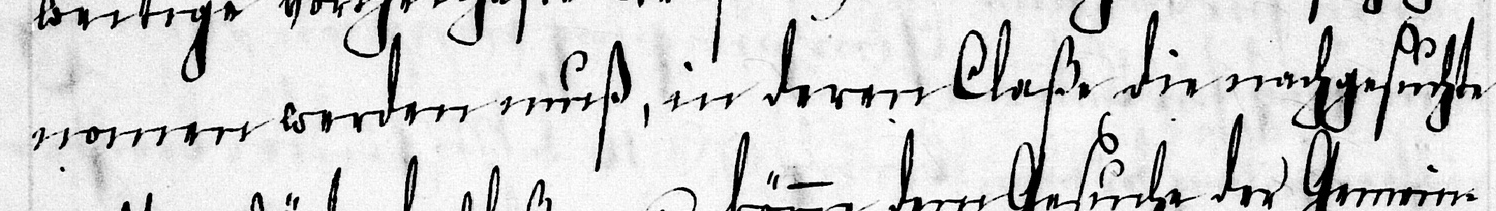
enommen werden muß, in deren Claße die nachgesuchte
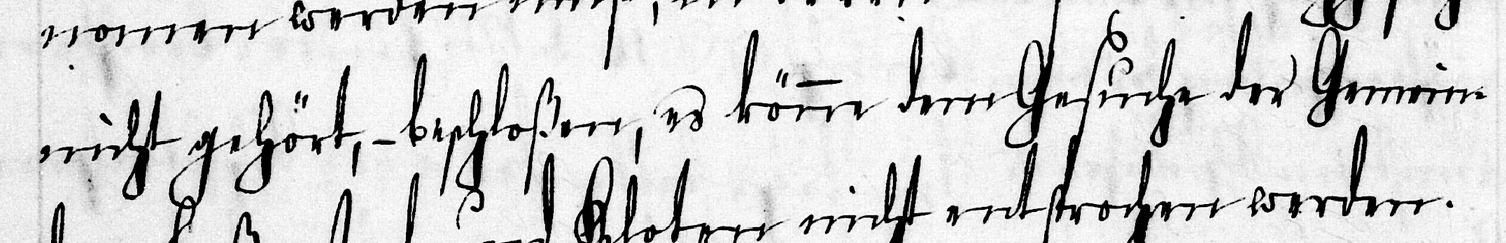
nicht gehört, – beschloßen, es könne dem Gesuche der Gemein¬
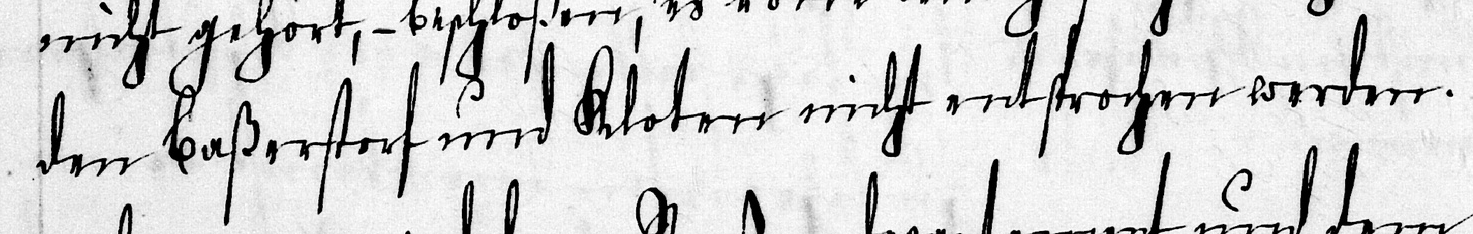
den Baßerstorf und Kloten nicht entsprochen werden.
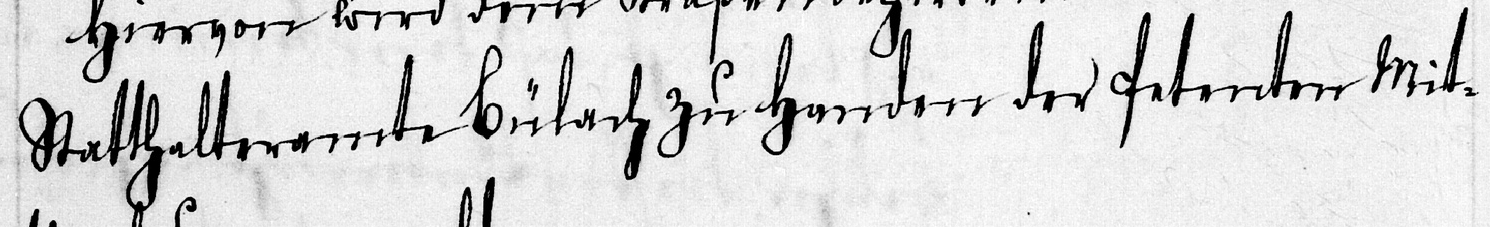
Statthalteramte Bülach zu Handen der Petenten Mit¬
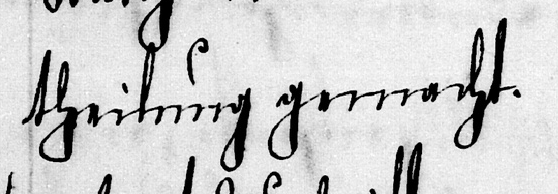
theilung gemacht.
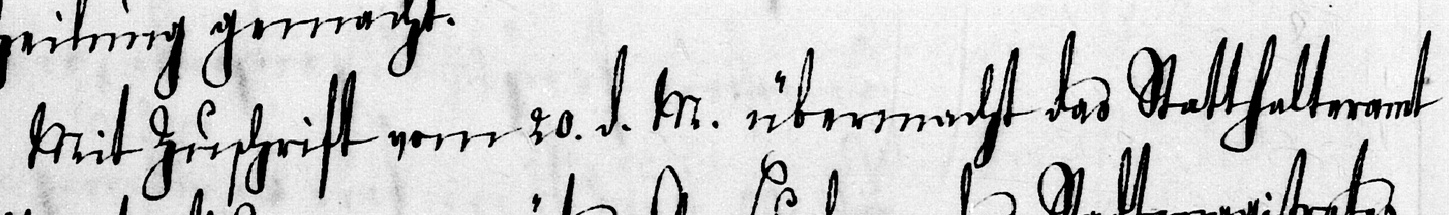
Mit Zuschrift vom 20. d. M. übermacht das Statthalteramt
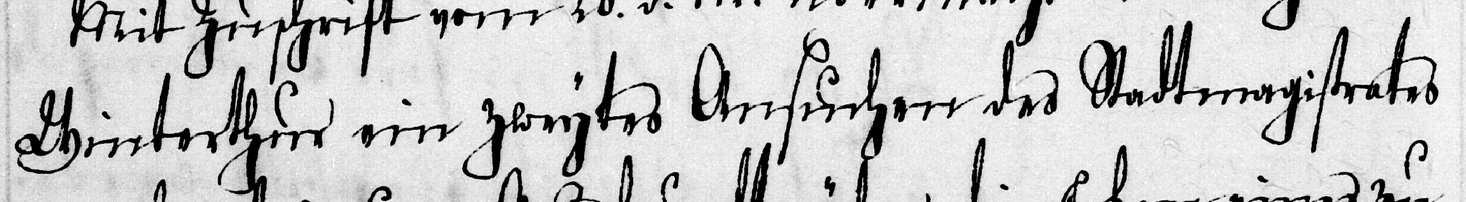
Winterthur ein zweytes Ansuchen des Stadtmagistrates
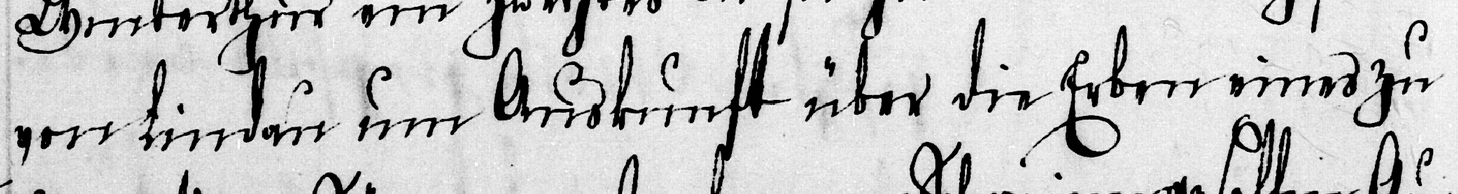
von Lindau um Auskunft über die Erben eines zu
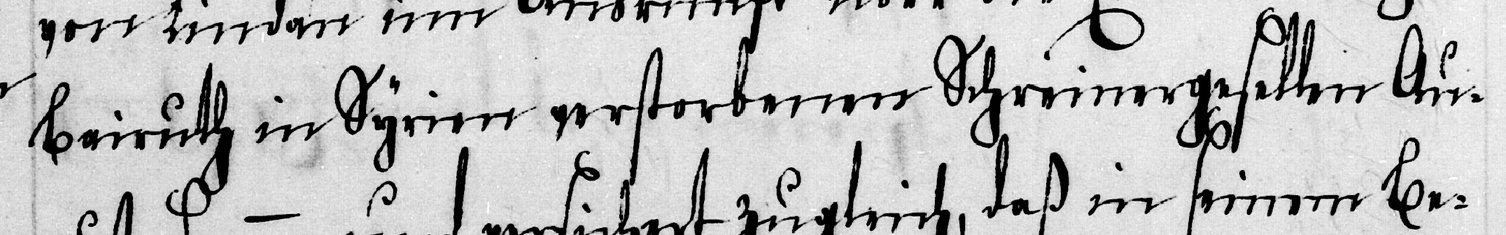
Bairuth in Syrien verstorbenen Schreinergesellen Au¬
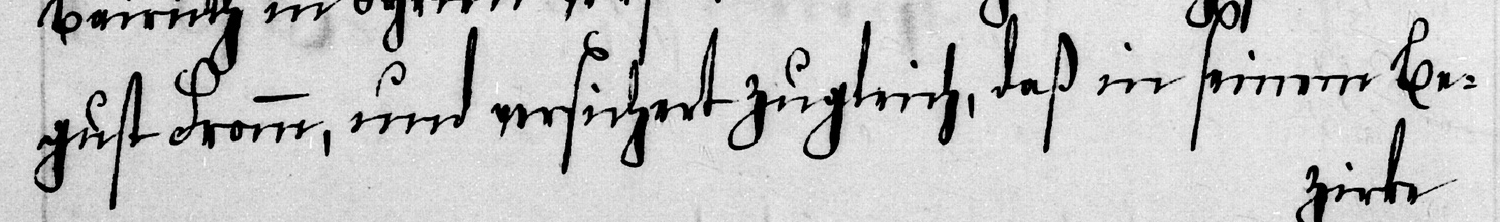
gust Fromm, und versichert zugleich, daß in seinem Be-
